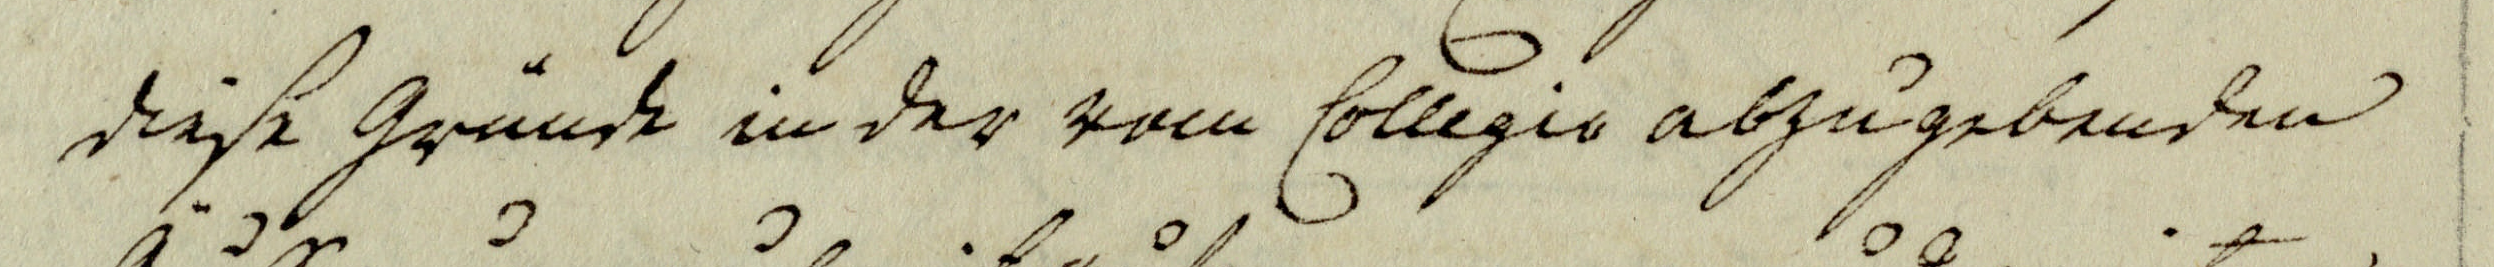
diese Gründe in der vom Collegio abzugebenden
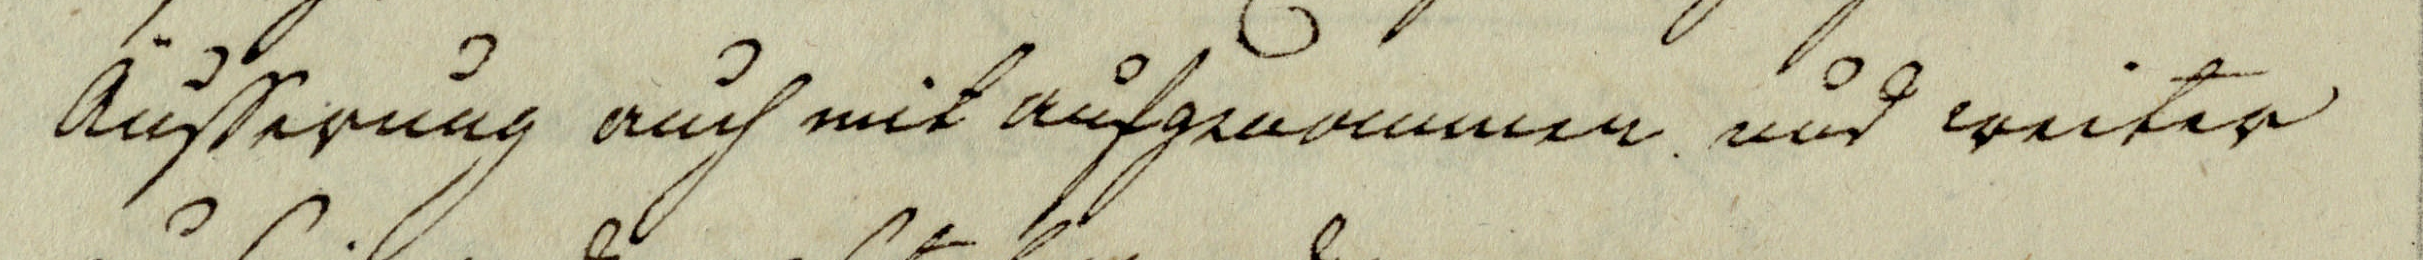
Äusserung auch mit aufgenommen und weiter
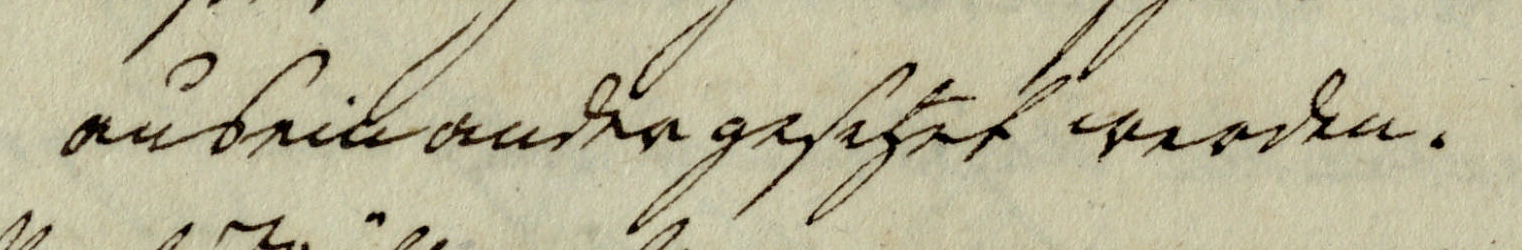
auseinander gesetzet werden.
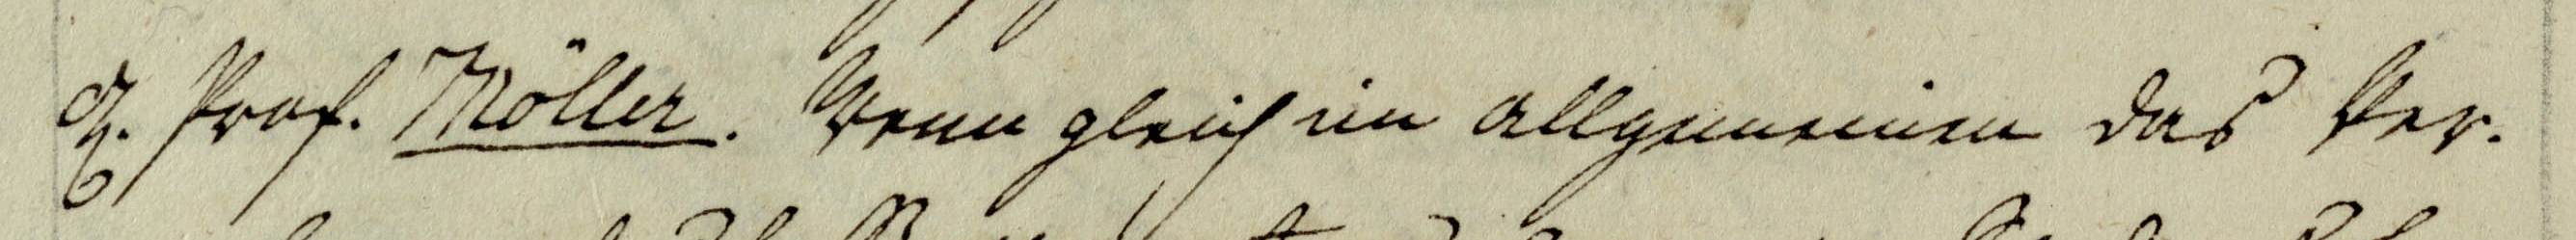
dh. Prof. Möller. Wenn gleich im Allgemeinen das Ver¬
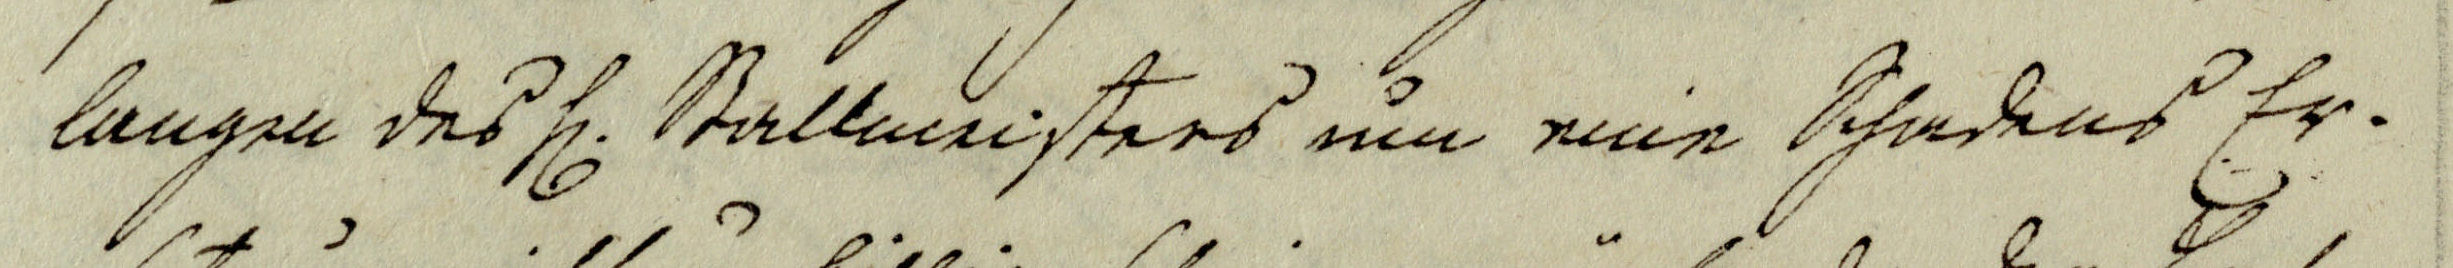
langen des H. Stallmeisters um eine Schadens Er¬
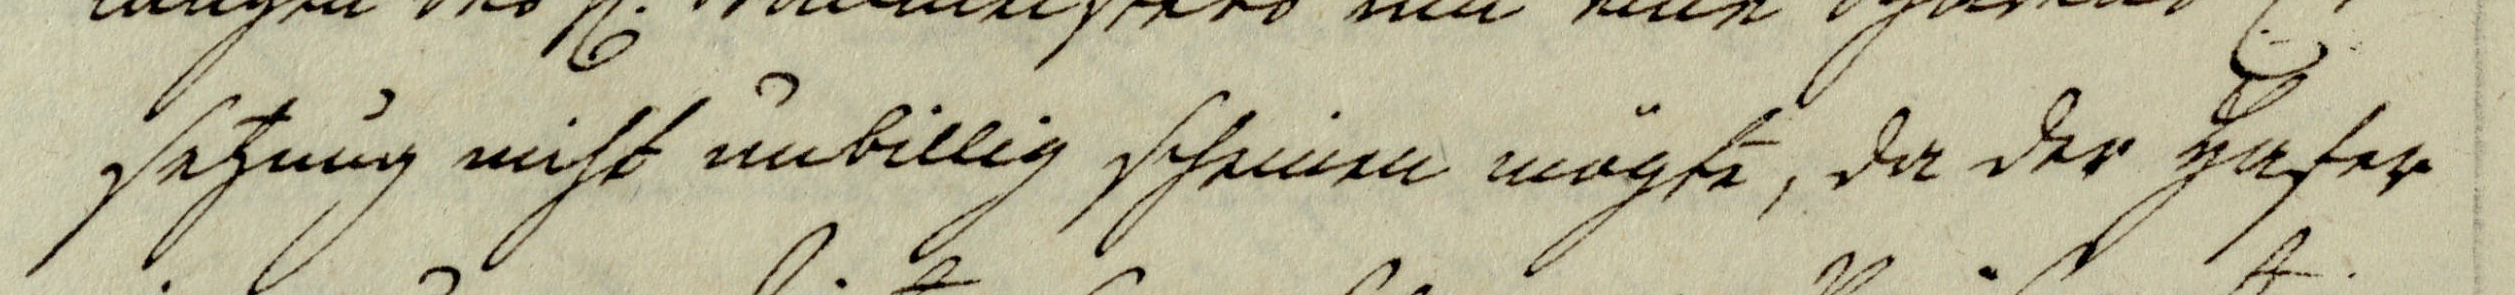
setzung nicht unbillig scheinen mögte, da der Hafer
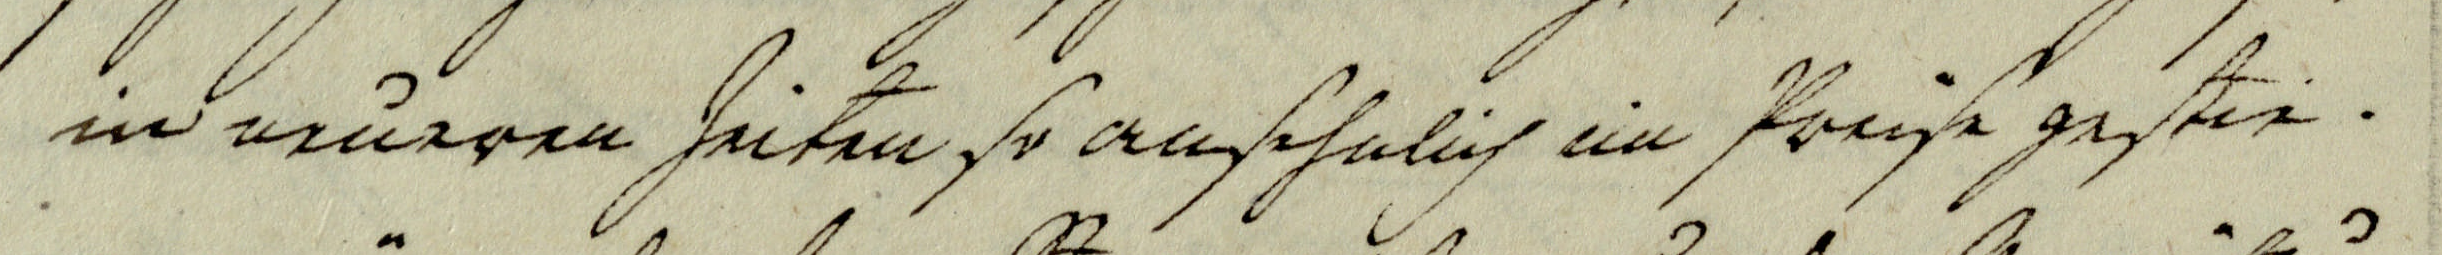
in neueren Zeiten so ansehnlich in Preise gestie¬
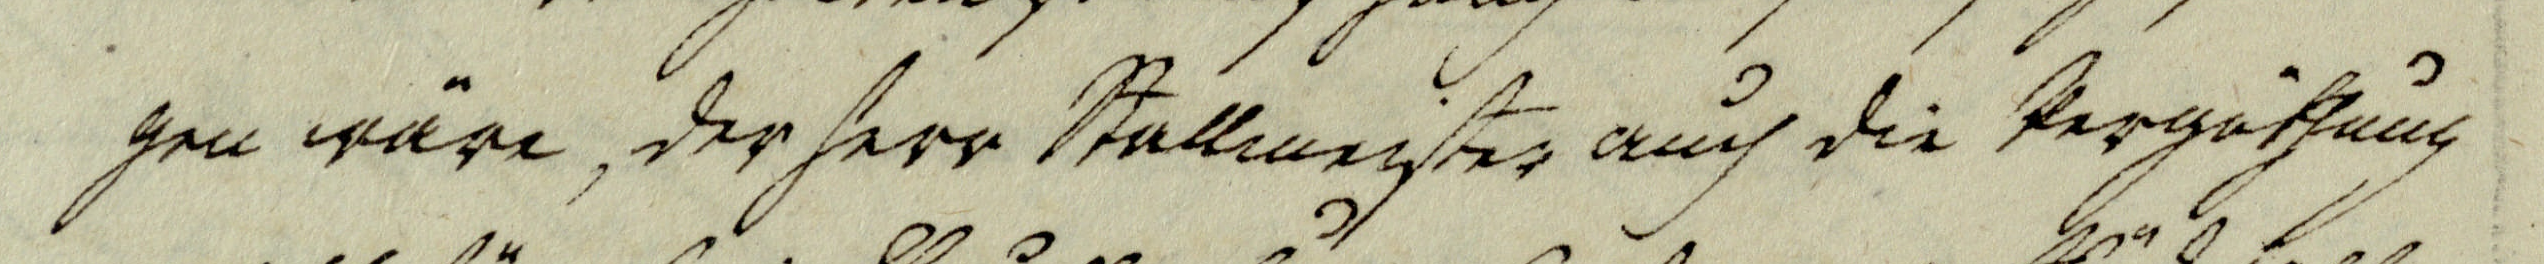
gen wäre, der Herr Stallmeister auch die Vergüthung
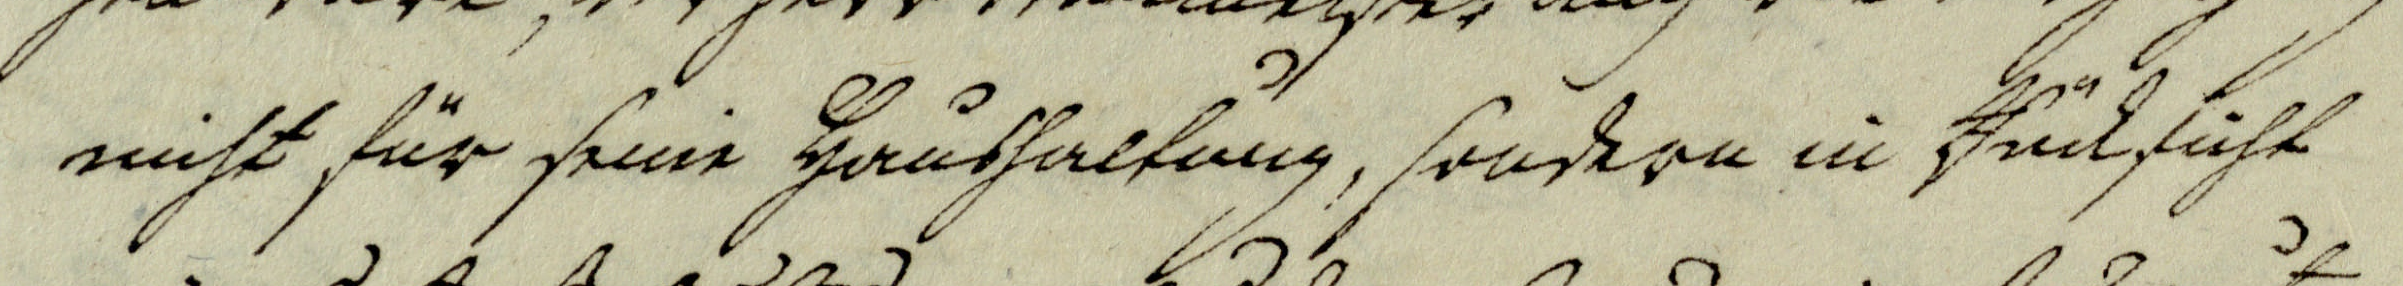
nicht für seine Haushaltung, sondern in Rücksicht
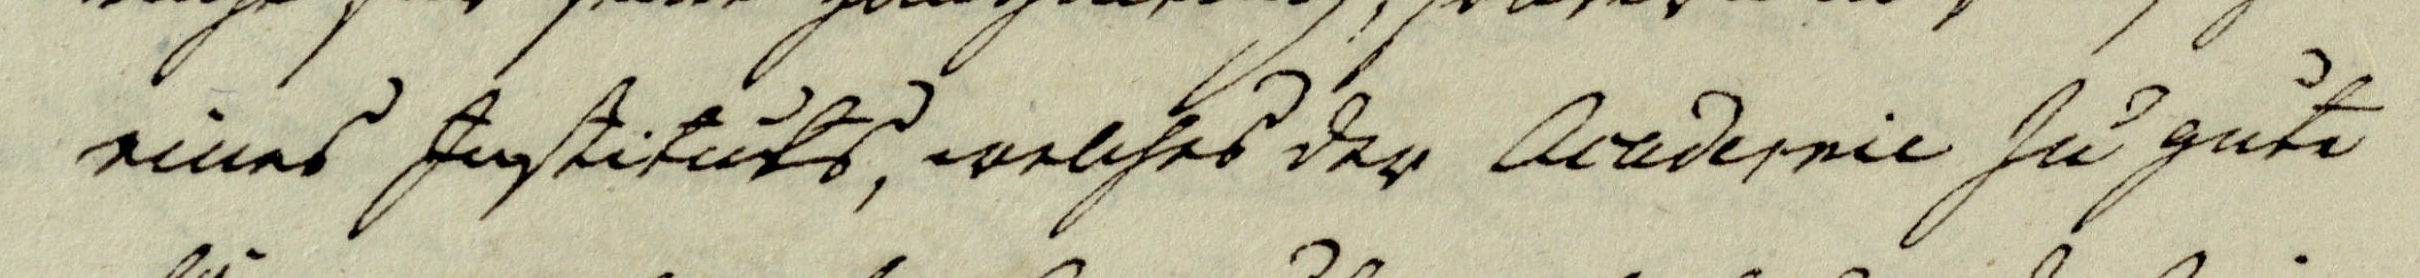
eines Instituts, welches der Academie zu gute
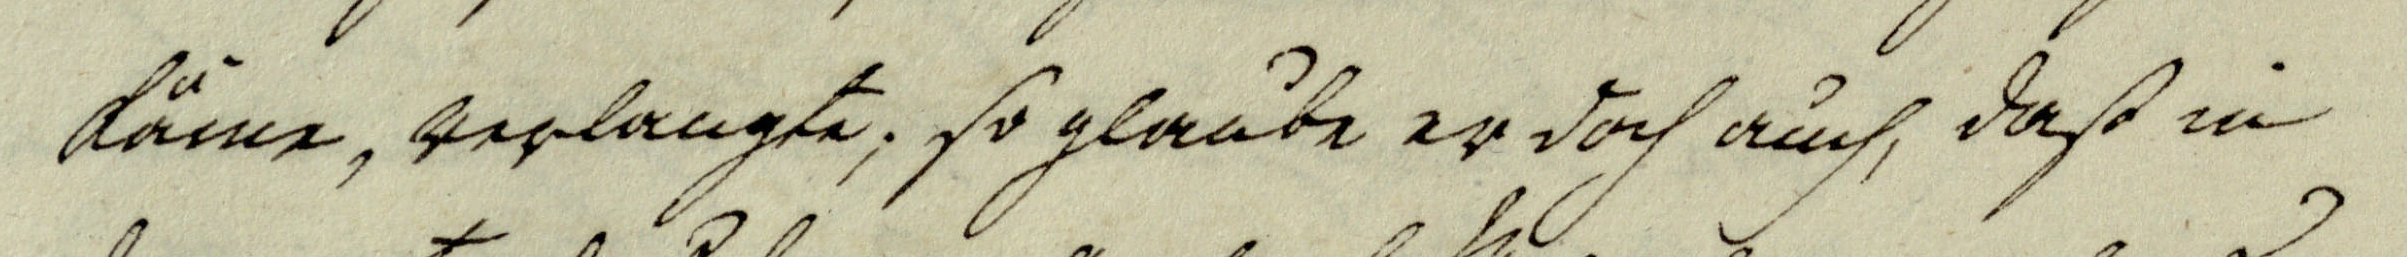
käme, verlangte, so glaube er doch auch, daß in
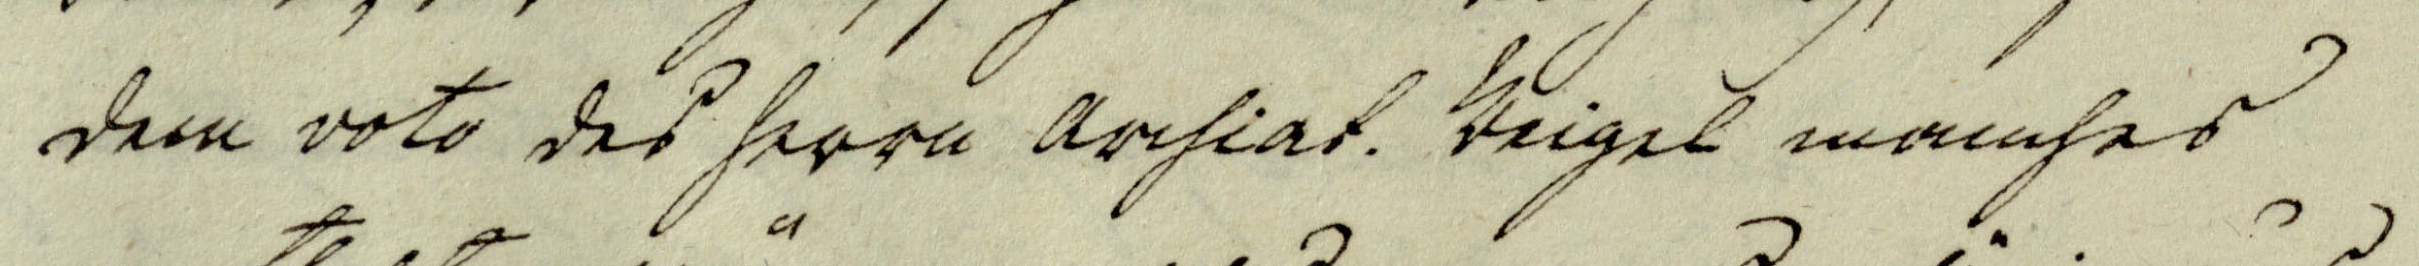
dem voto des Herrn Archiat. Weigel manches
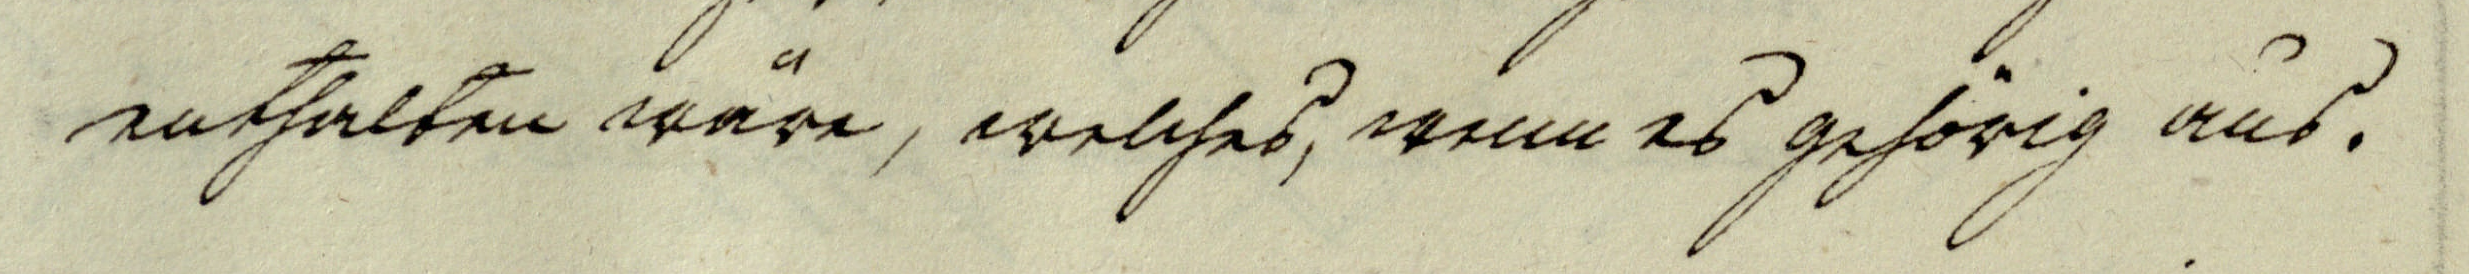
enthalten wäre, welches, wenn es gehörig aus¬
